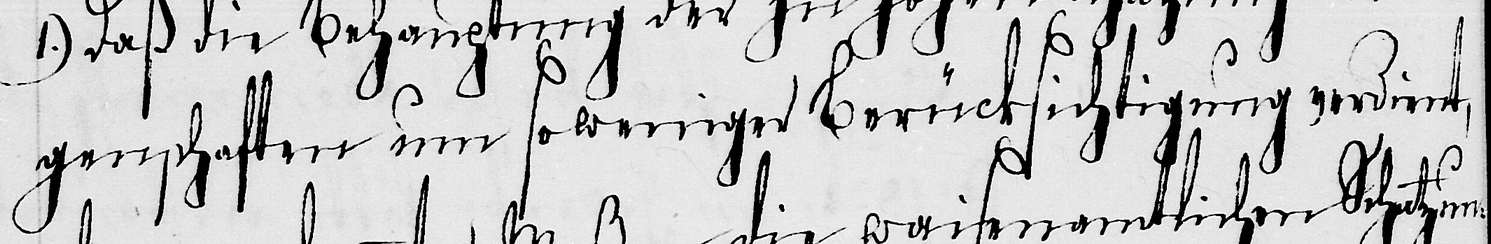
egenschaften um soweniger Berücksichtigung verdien¬
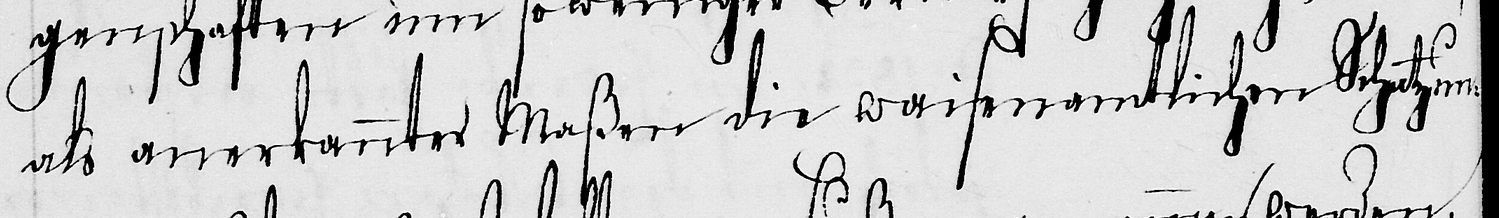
als anerkannter Maßen die waisenamtlichen Schatzun¬
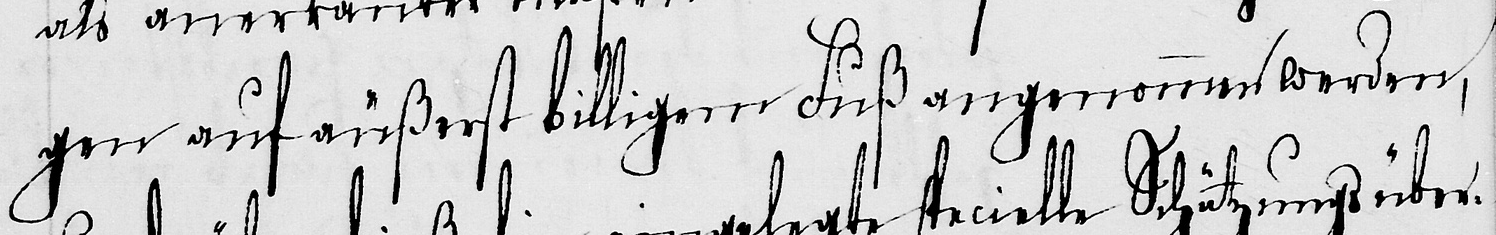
gen auf äußerst billigem Fuß angenommen werden,
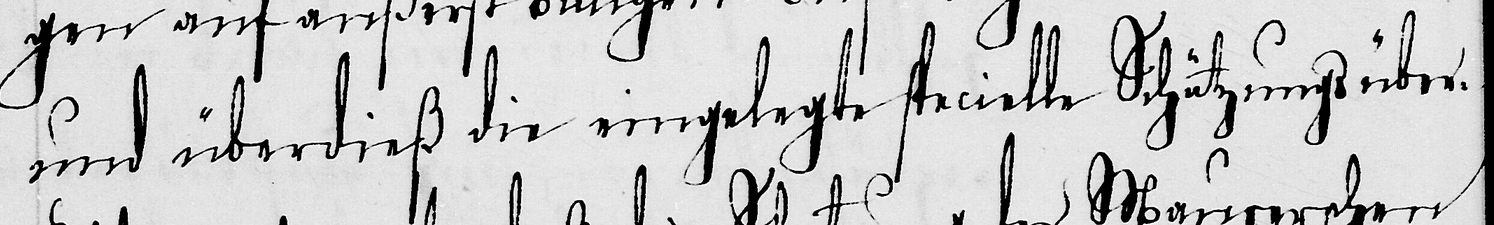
und überdieß die eingelegte specielle Schätzung¬
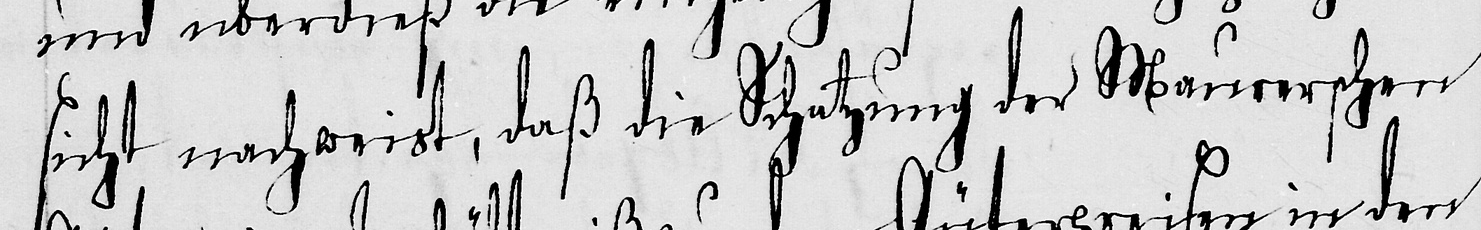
sicht nachweist, daß die Schatzung der Maurerschen
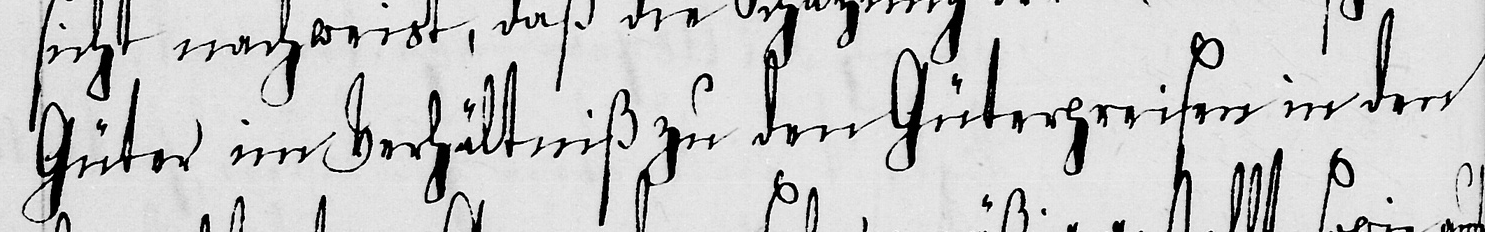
Güter im Verhältniß zu den Güterpreisen in den
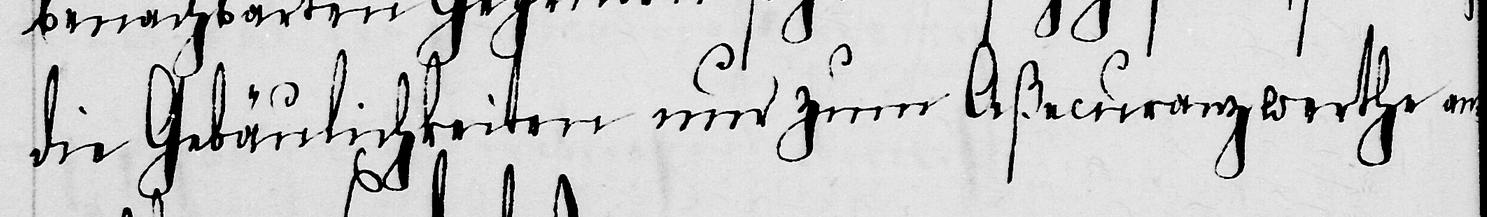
die Gebäulichkeiten nur zum Aßecuranzwerthe a¬
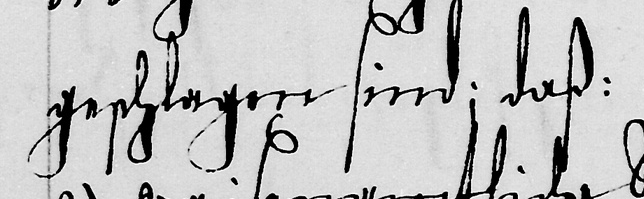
ngeschlagen sind; daß:
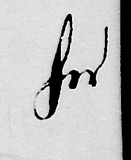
hir-
